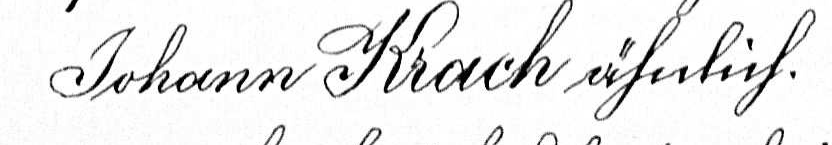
Johann Krach ähnlich.
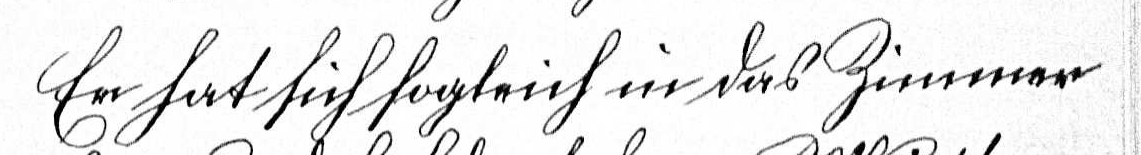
Er hat sich sogleich in das Zimmer
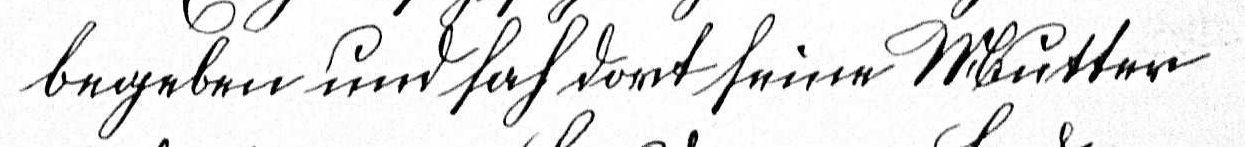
begeben und sah dort seine Mutter
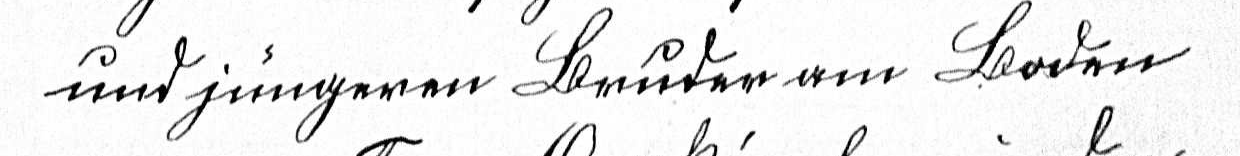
und jüngeren Bruder am Boden
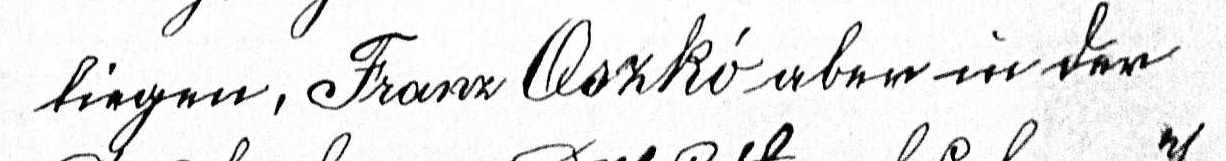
liegen, Franz Oszkó aber in der
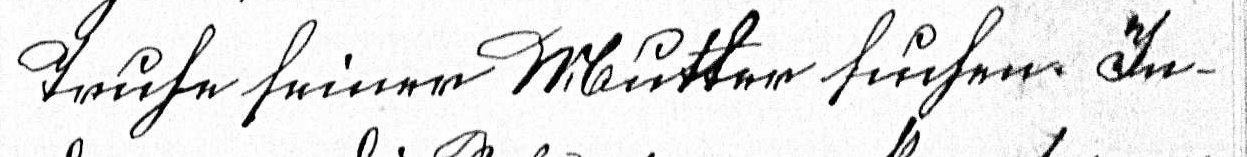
Truhe seiner Mutter suchen. In¬
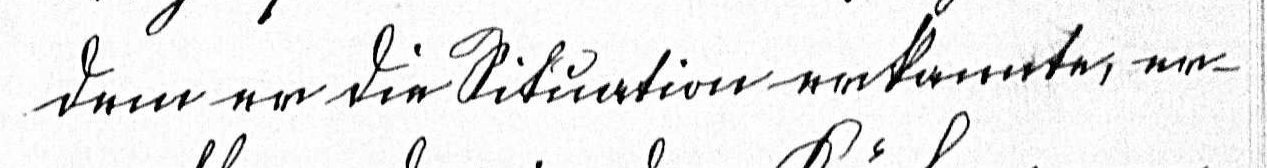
dem er die Situation erkannte, er¬
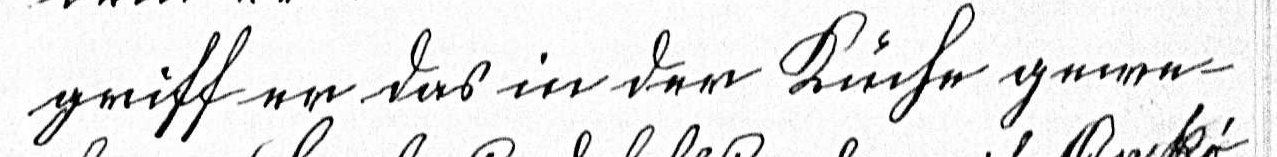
griff er das in der Küche gewe¬
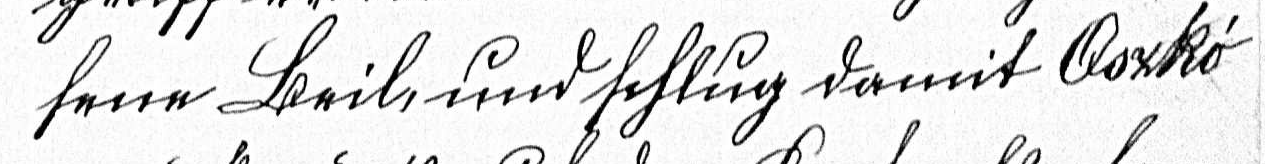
sene Beil, und schlug damit Oszkó
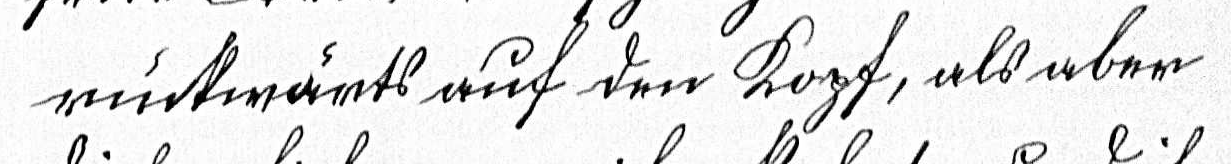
rückwärts auf den Kopf, als aber
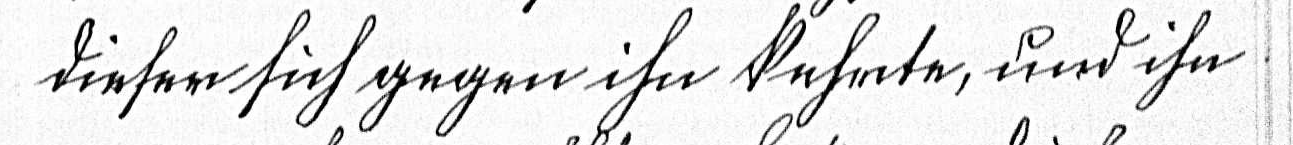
dieser sich gegen ihn kehrte, und ihn
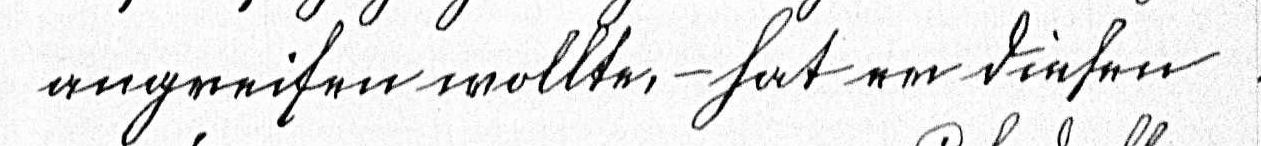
angreifen wollte, -- hat er diesen
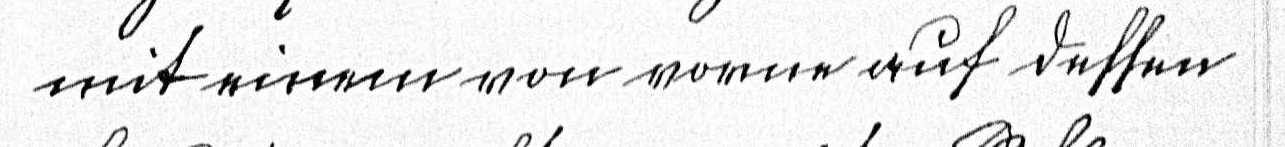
mit einem von vorne auf dessen
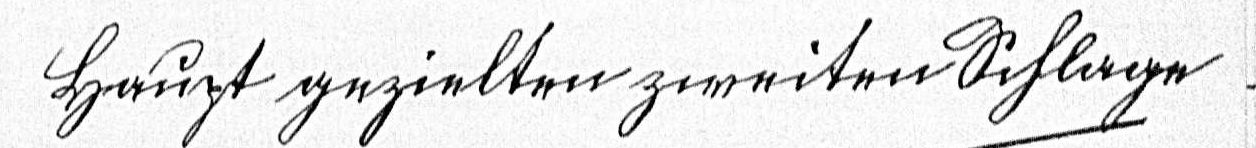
Haupt gezielten zweiten Schlage
